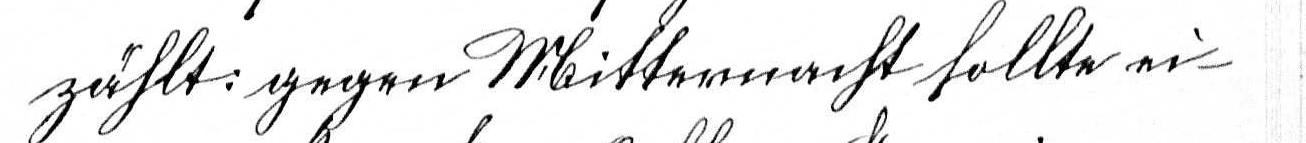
zählt: gegen Mitternacht sollte ei¬
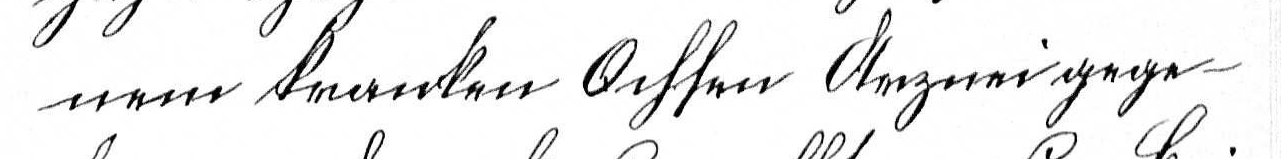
nem kranken Ochsen Arznei gege¬
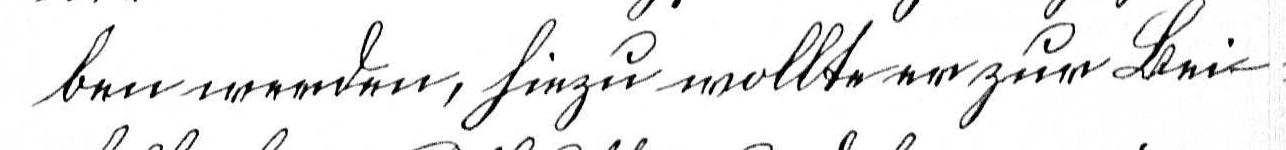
ben werden, hinzu wollte er zur Bei¬
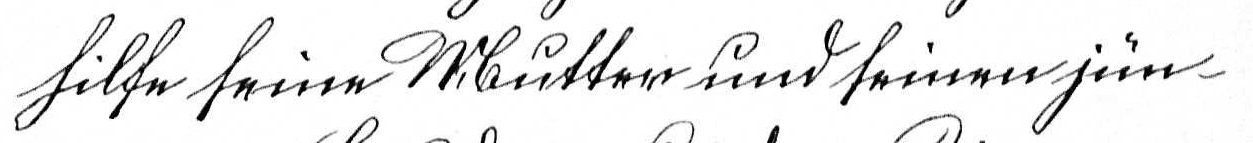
hilfe seine Mutter und seinen jün¬
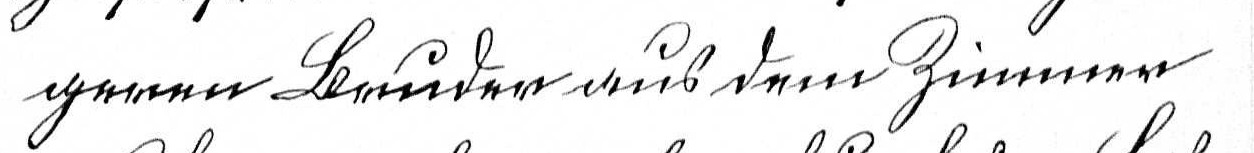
geren Bruder aus dem Zimmer
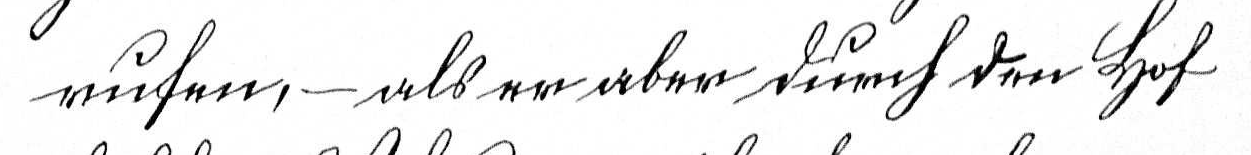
rufen, -- als er aber durch den Hof¬
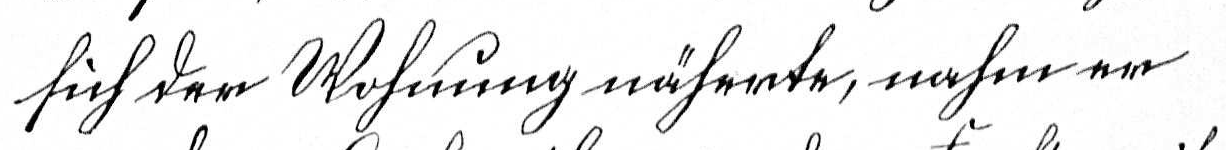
sich der Wohnung näherte, nahm er
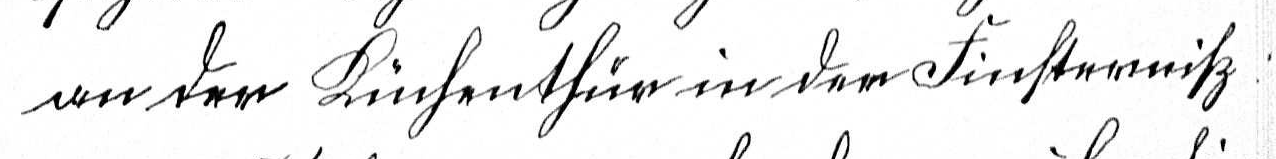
an der Küchenthür in der Finsterniß
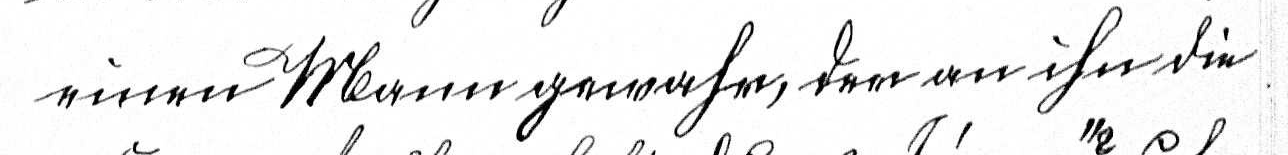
einen Mann gewahr, der an ihn die
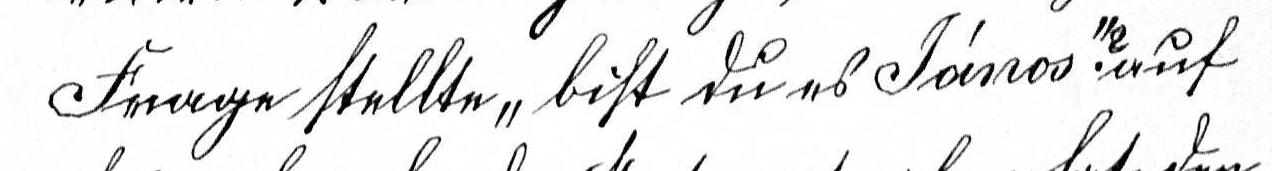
Frage stellte „bist du es János?“ auf
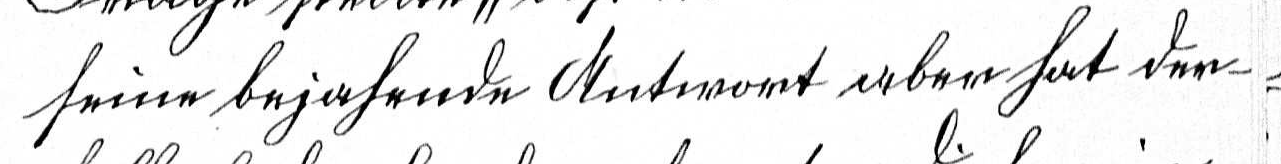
seine bejahende Antwort aber hat der¬
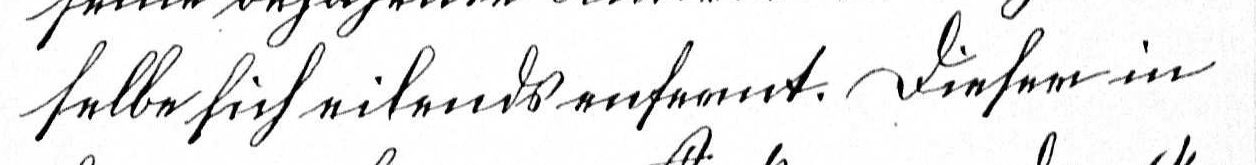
selbe sich eilends enfernt. Dieser in
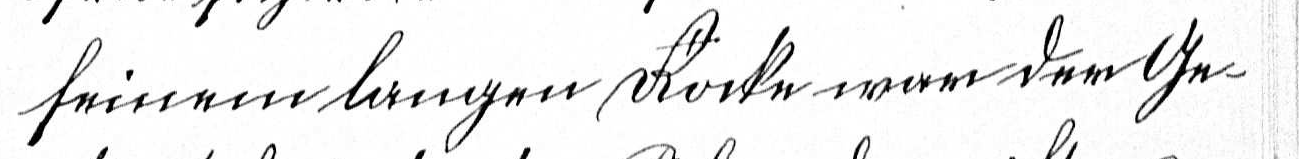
seinem langen Rocke war der Ge¬
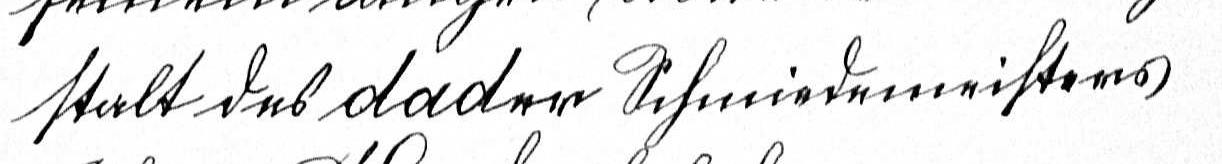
stalt des dad’er Schmiedemeisters
